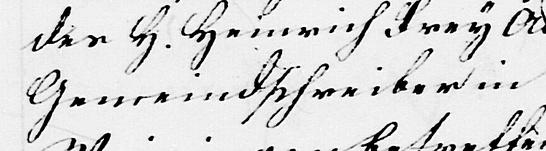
Gemeindschreiber in
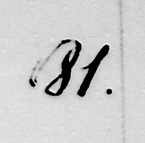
A.
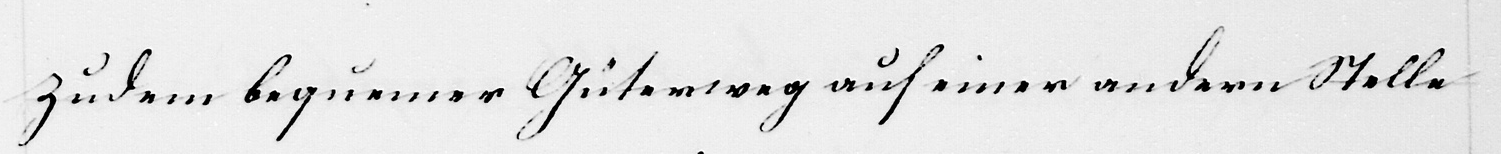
zudem bequemer Güterweg auf einer andern Stelle
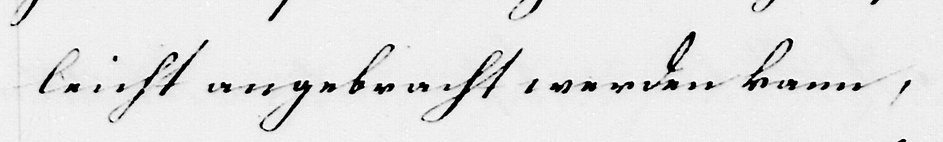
leicht angebracht werden kann,
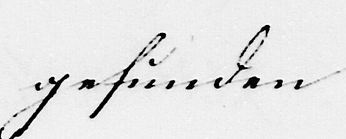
gefunden,
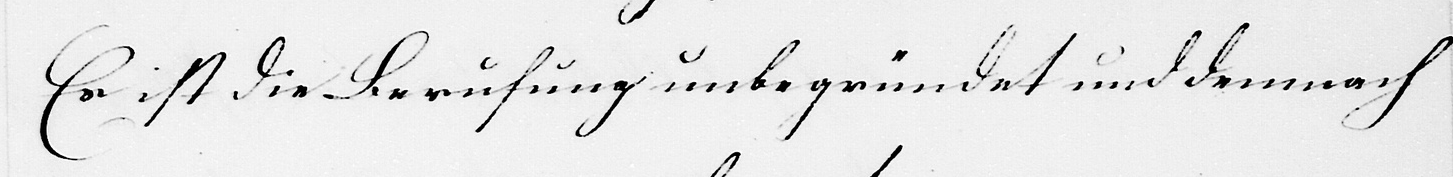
Es ist die Berufung unbegründet und demnach
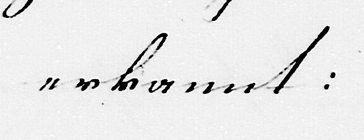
erkannt:
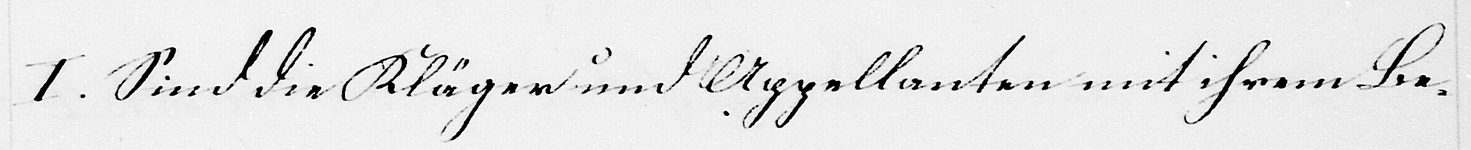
I. Sind die Kläger und Appellanten mit ihrem Be¬
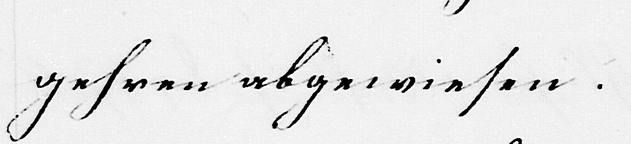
gehren abgewiesen.
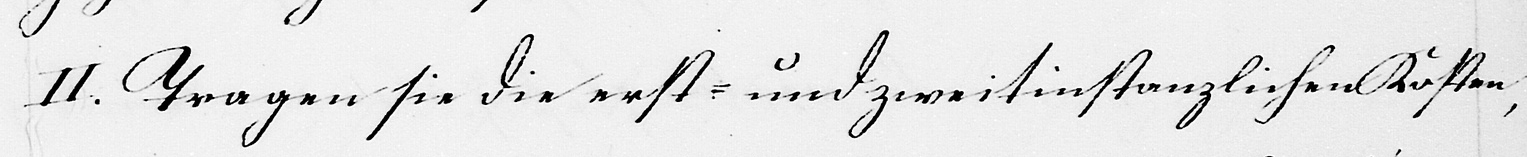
II. Tragen sie die erst- und zweitinstanzlichen Kosten,
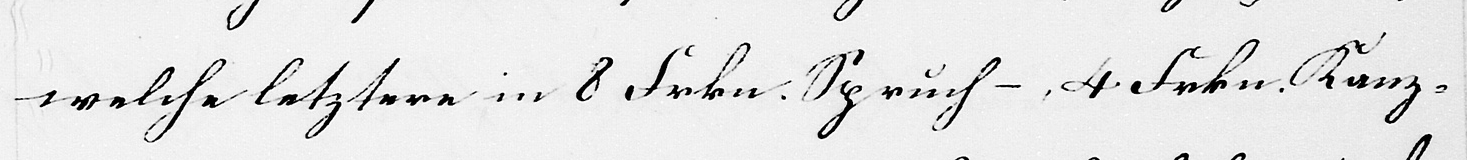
welche letztere in 8 Frkn. Spruch-, 4 Frkn. Kanz¬
